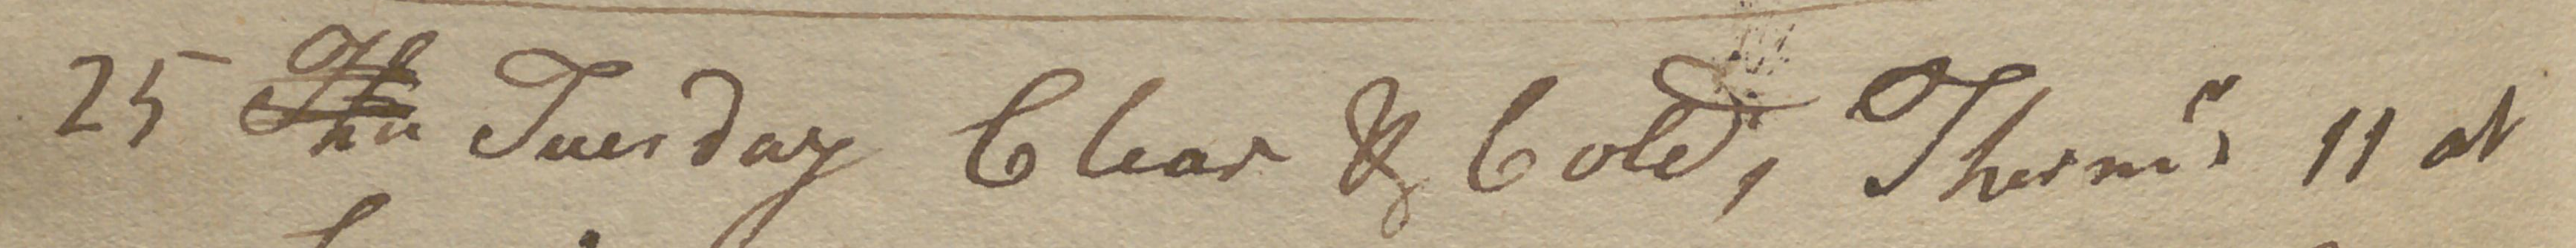25 [Thu] Tuesday Clear & Cold, Therm^r. 11 at
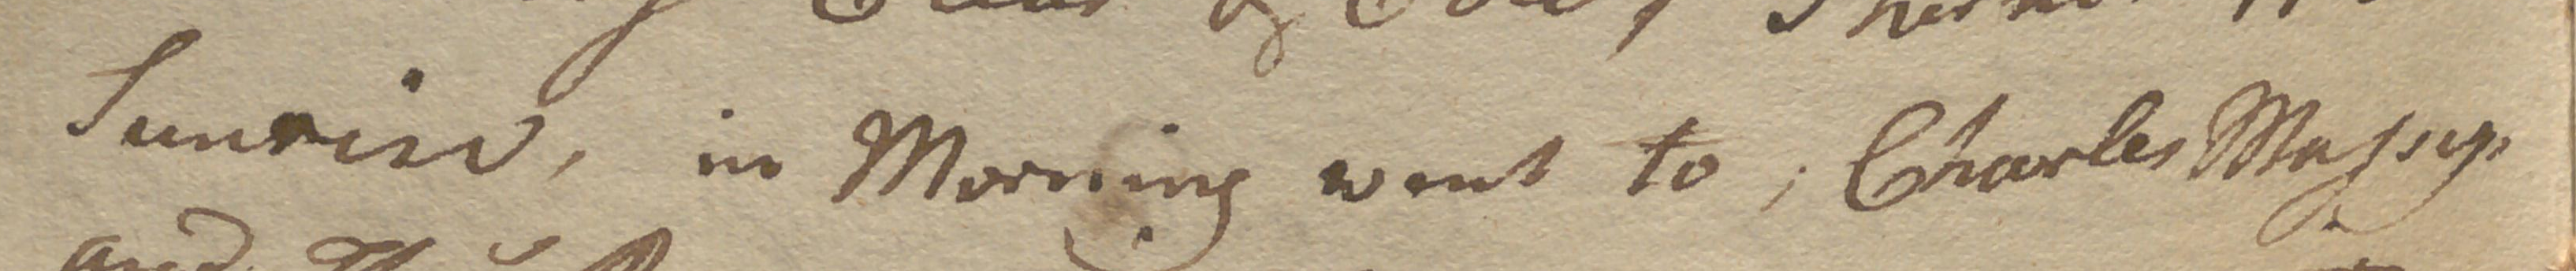Sunrise, in Morning went to, Charles Masseys
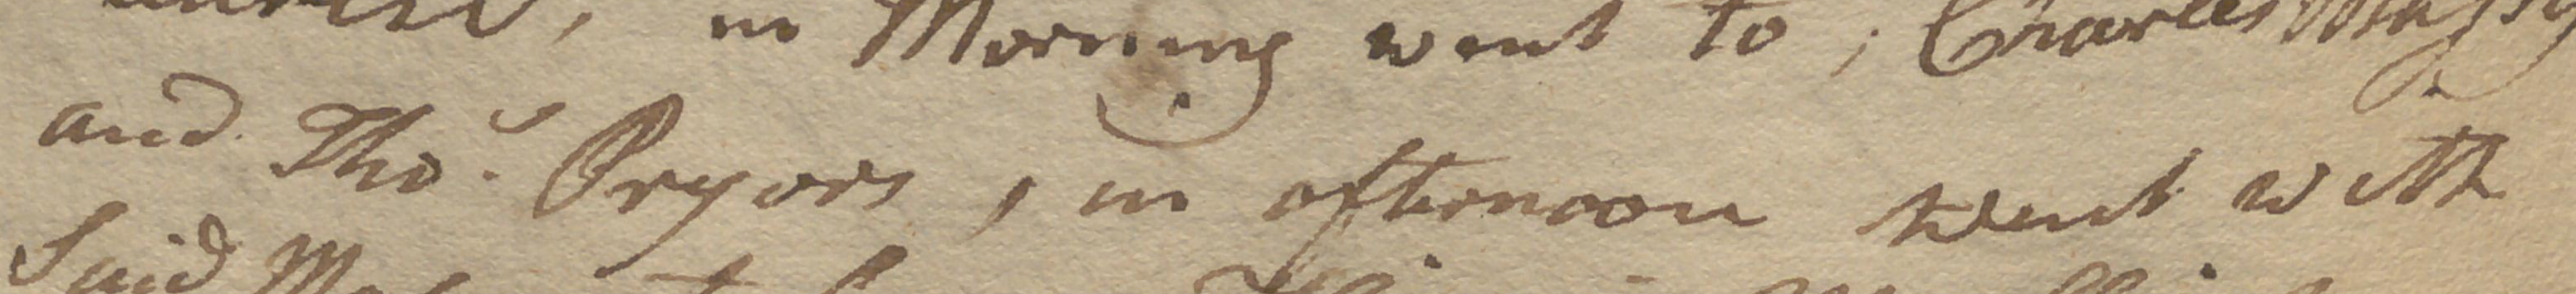and Tho^s. Pryors, in afternoon, went with
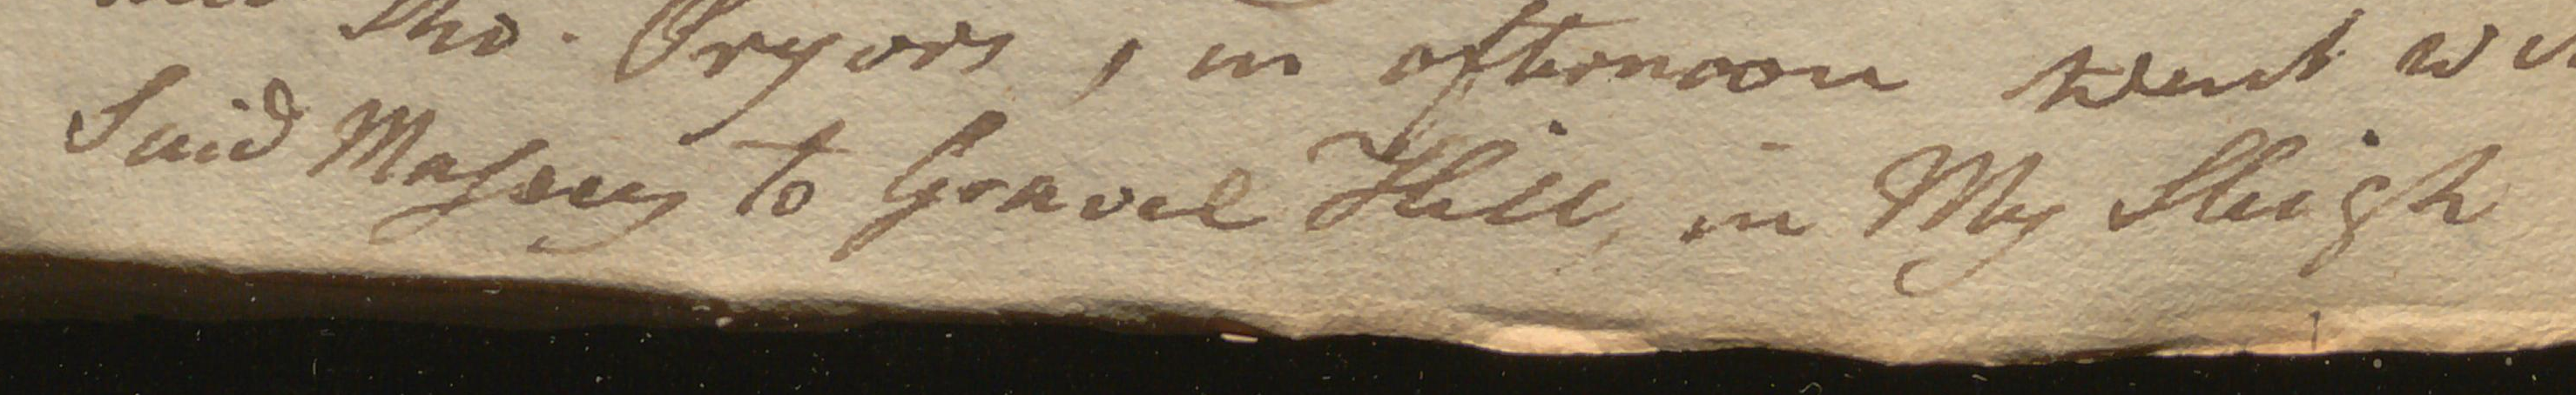Sand Massey to Geavel Hill, in My Sleigh
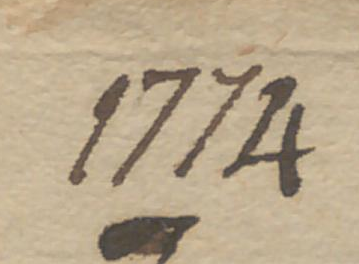1774
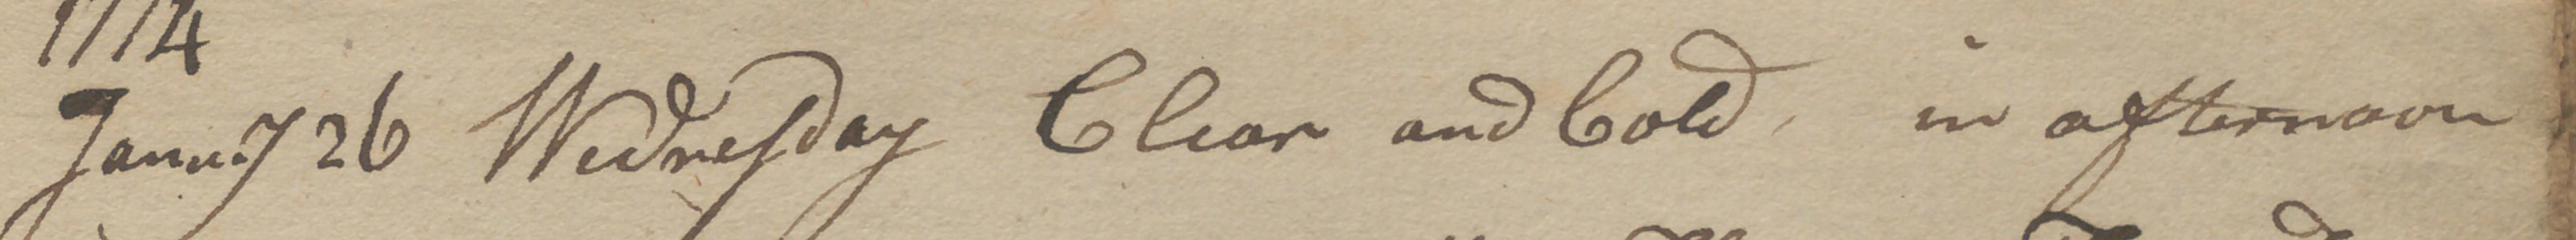Janu^y. 26 Wednesday Clear and Cold, in afternoon
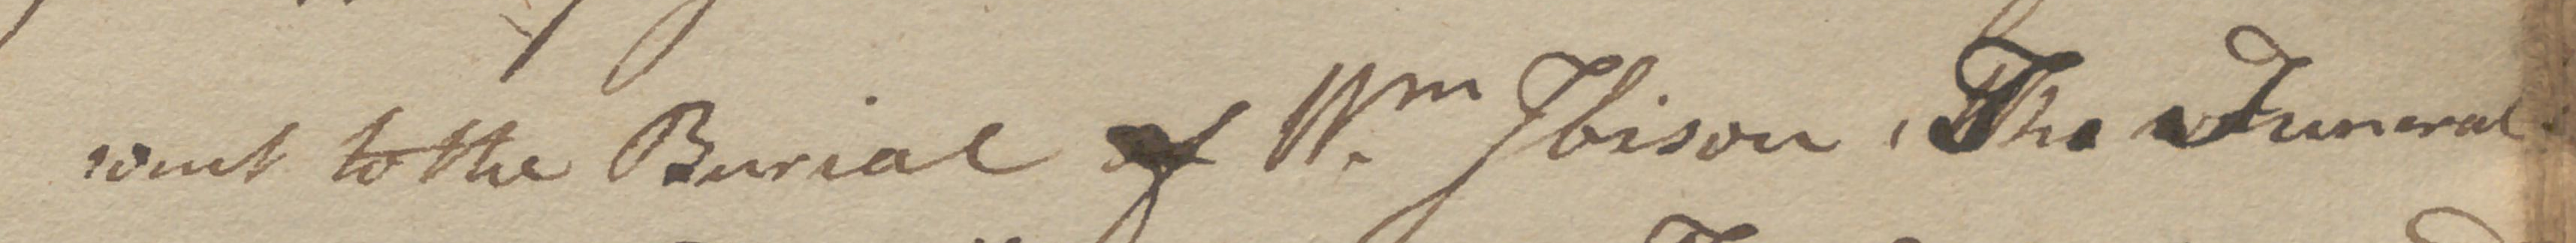went to the Burial of W^m. Ibison, The Auneral
